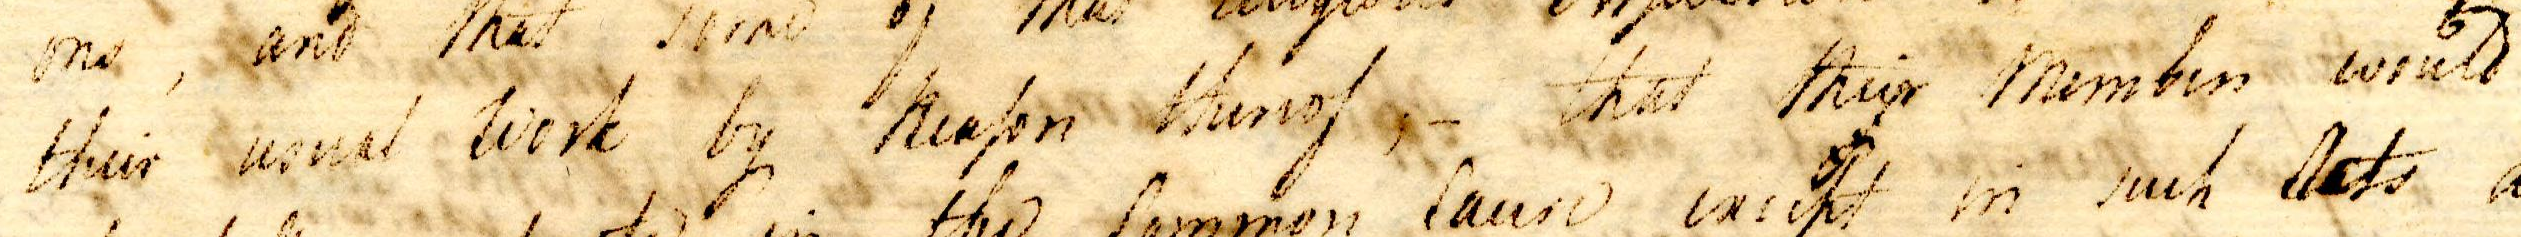their usual Work by Reason thereof, that their Members would
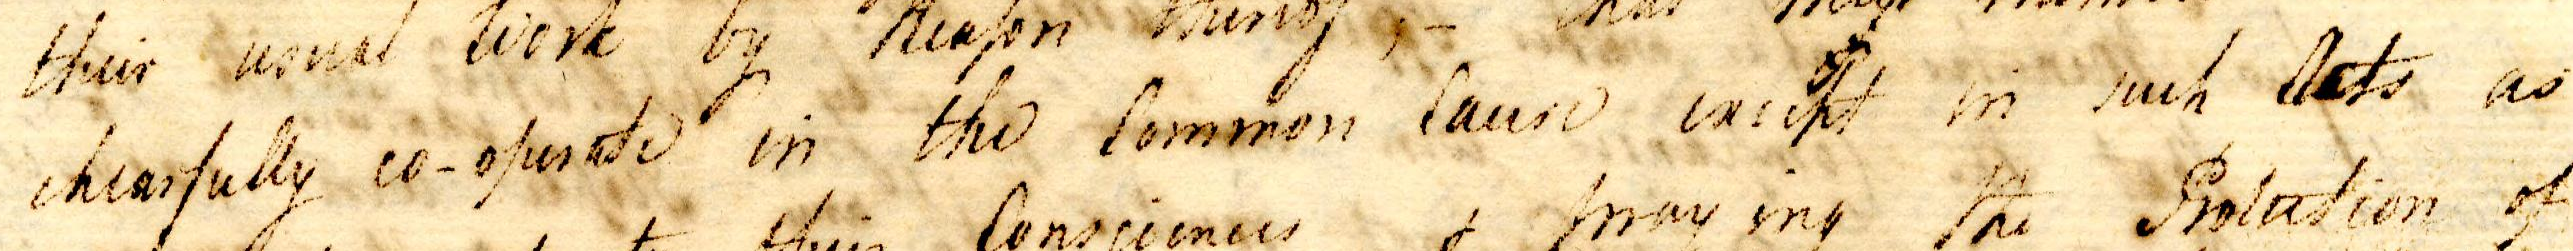chearfully co-operate in the Common Cause except in such Acts as
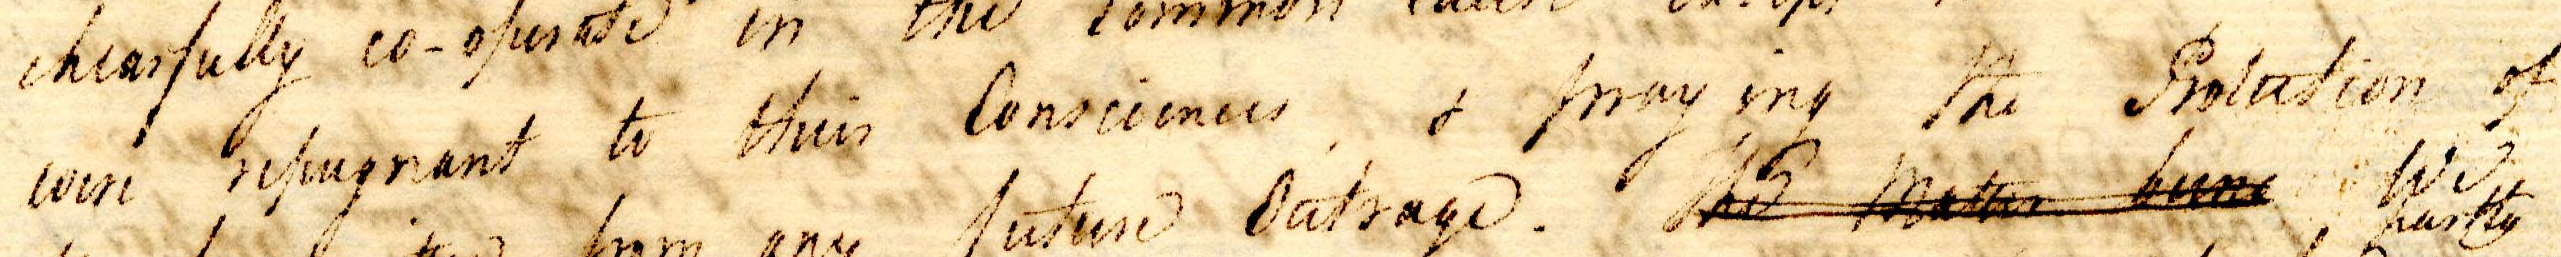were repugnant to their Consciences & praying the Protection of
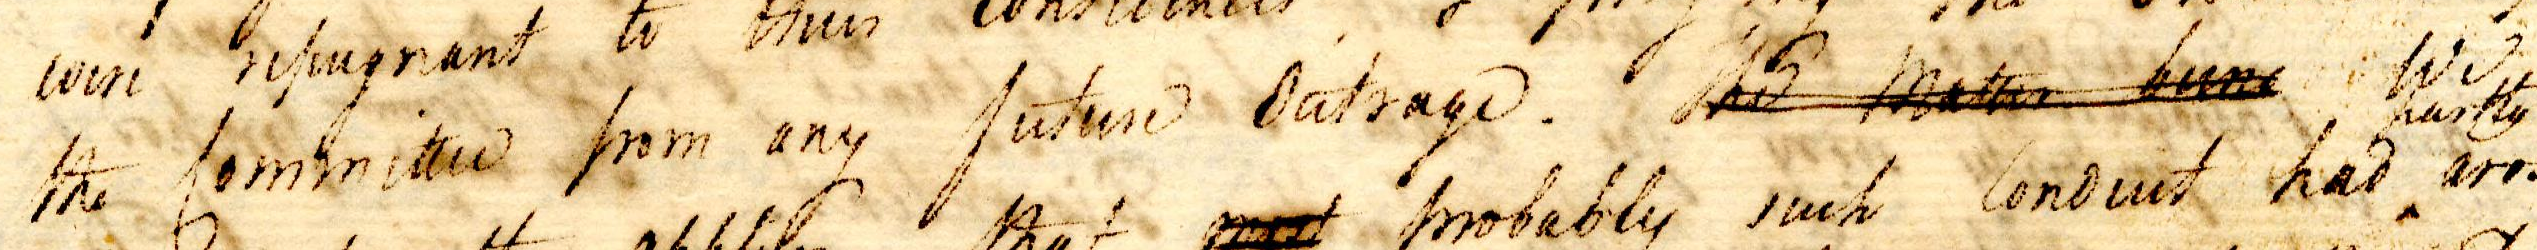the Committee from any future Outrage. The matter been we
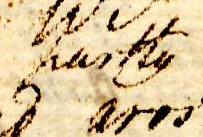partly
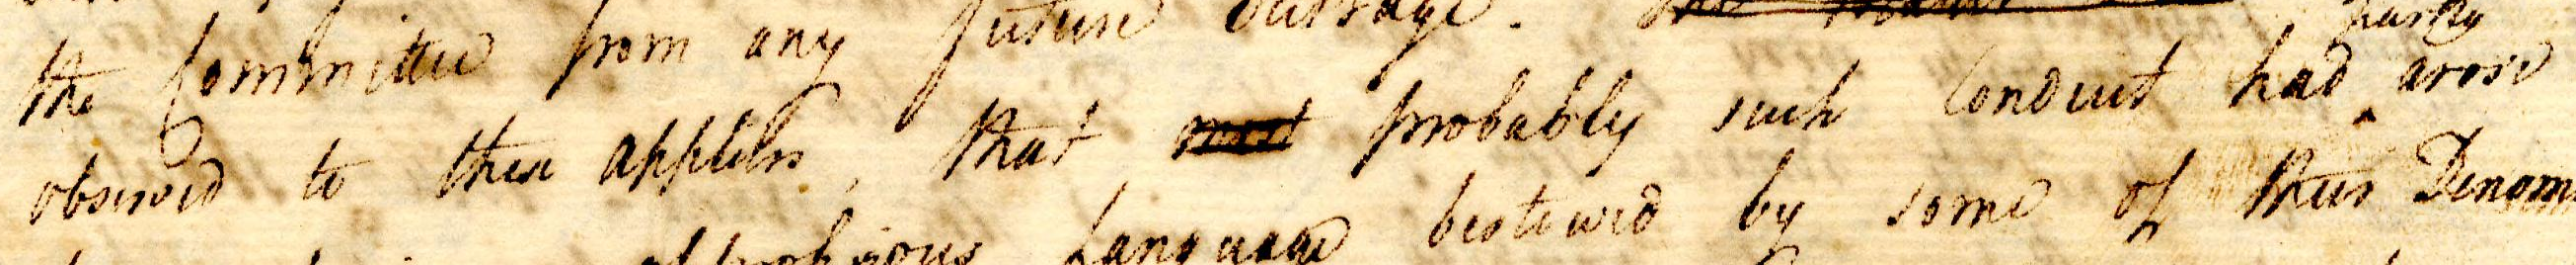observed to then applier, that most probably such Conduct had ^ arose
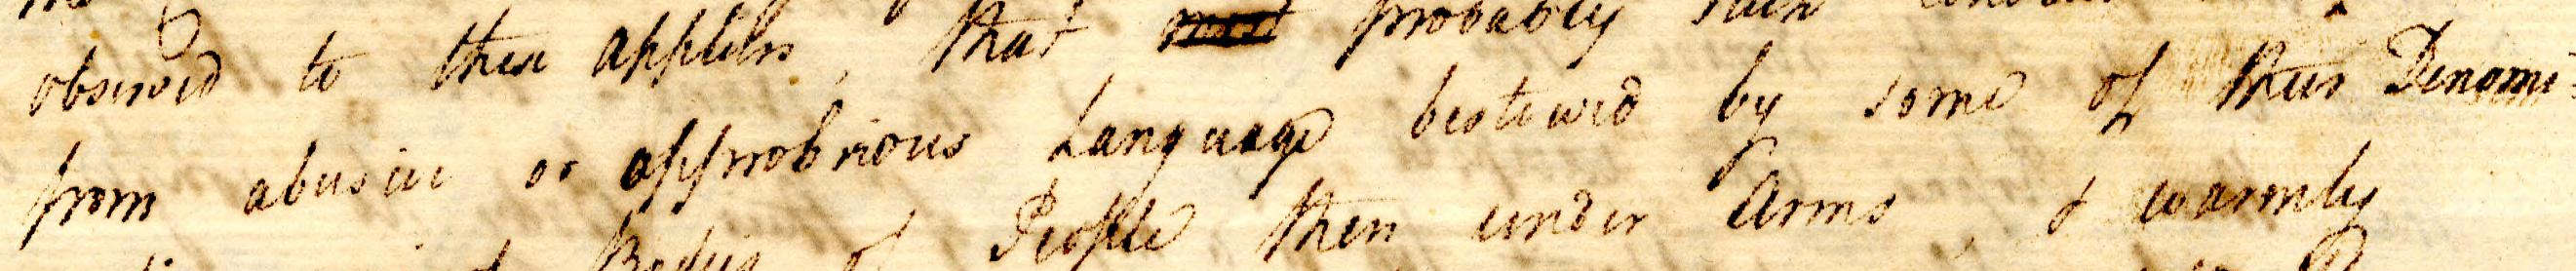from abusive os approbrious Langurge bestowed by some of their Denomi-
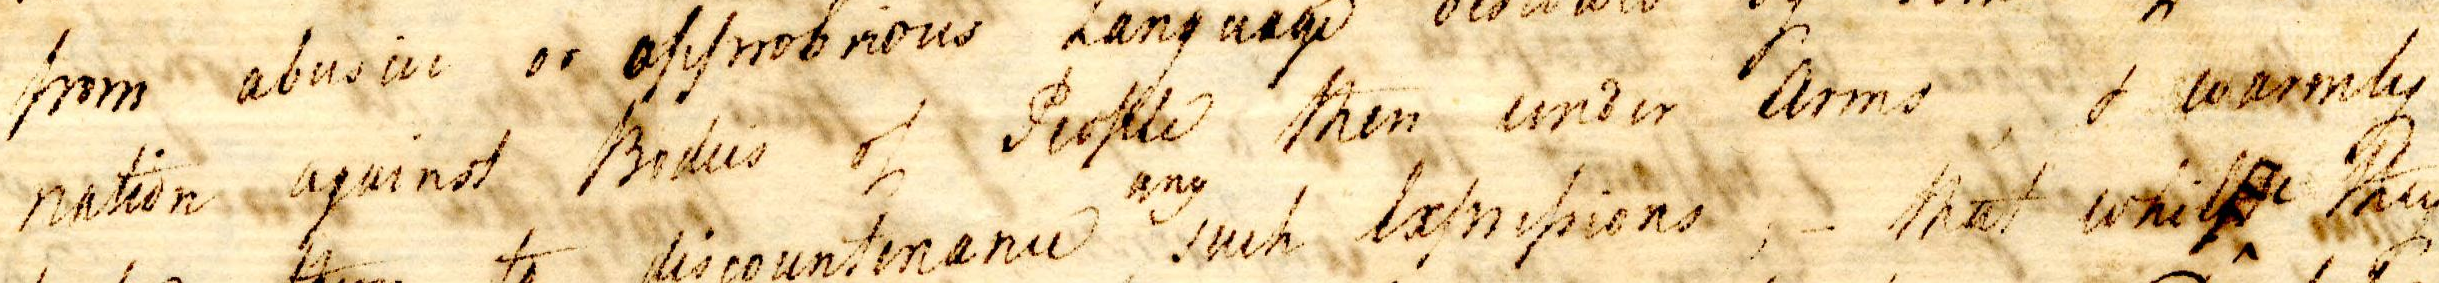-nation against Bodies of People then under Arms & warmly
